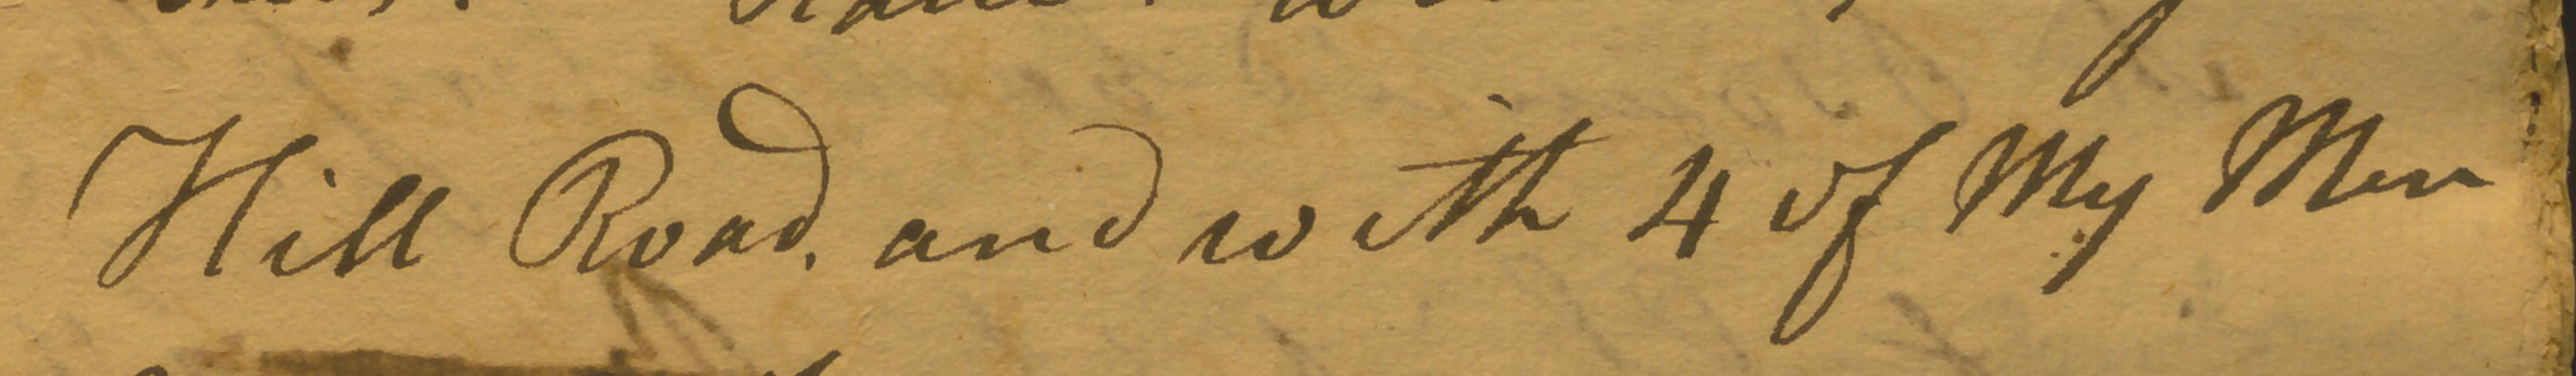Hill Road. and with 4 of My Men
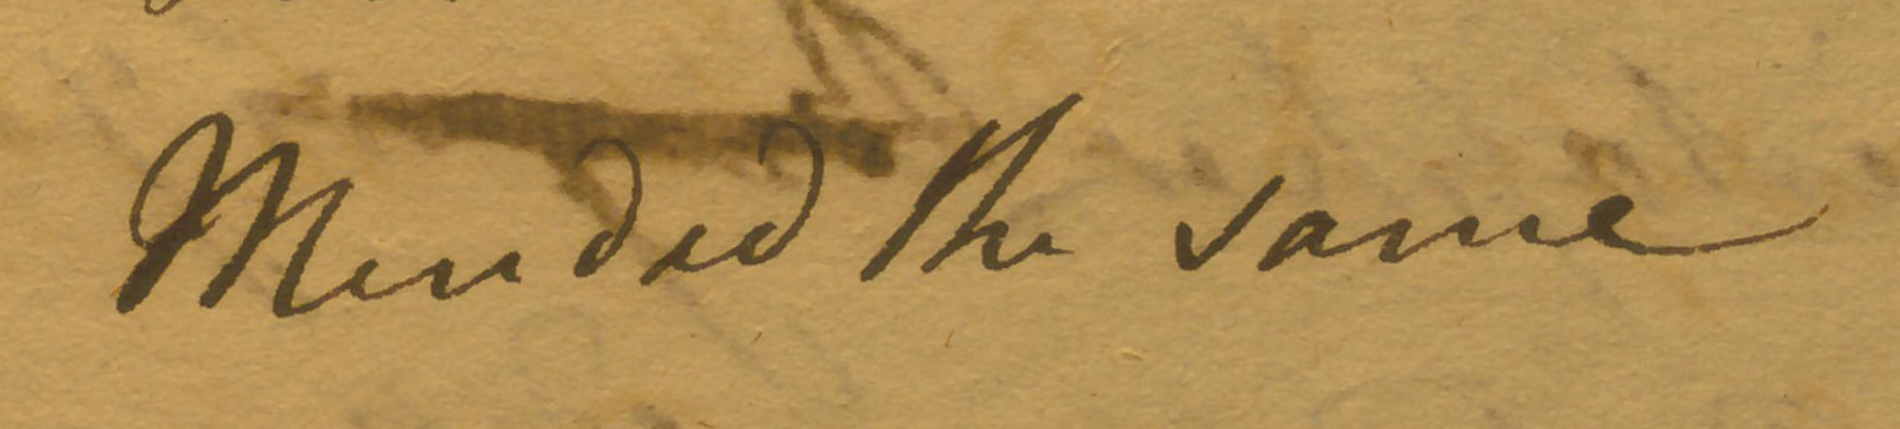Mended the same
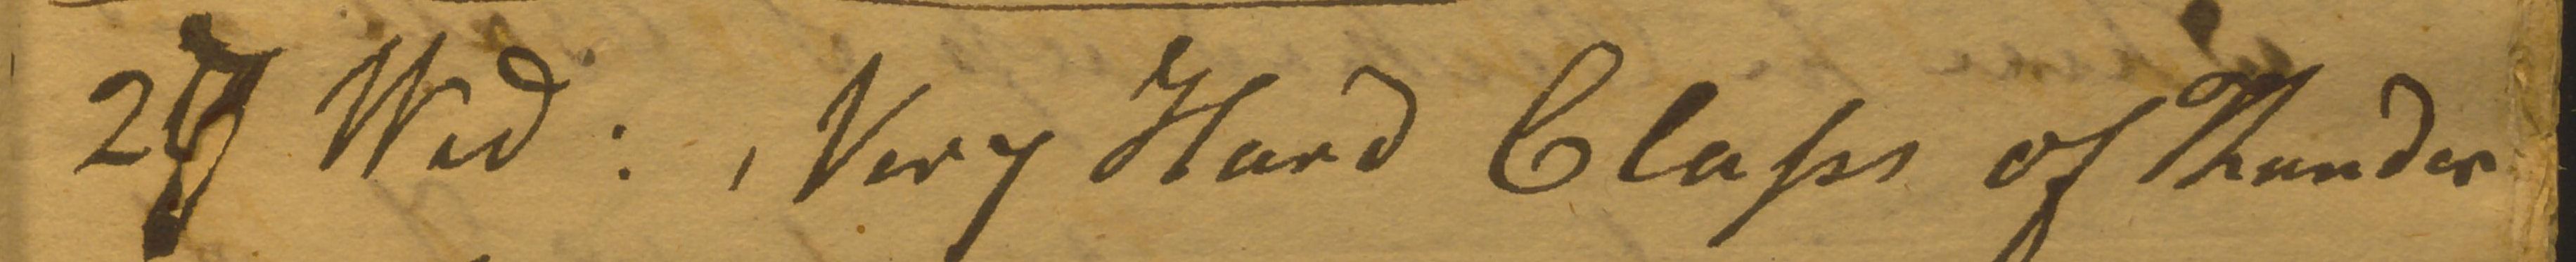27 Wed: Very Hard Claps of thunder
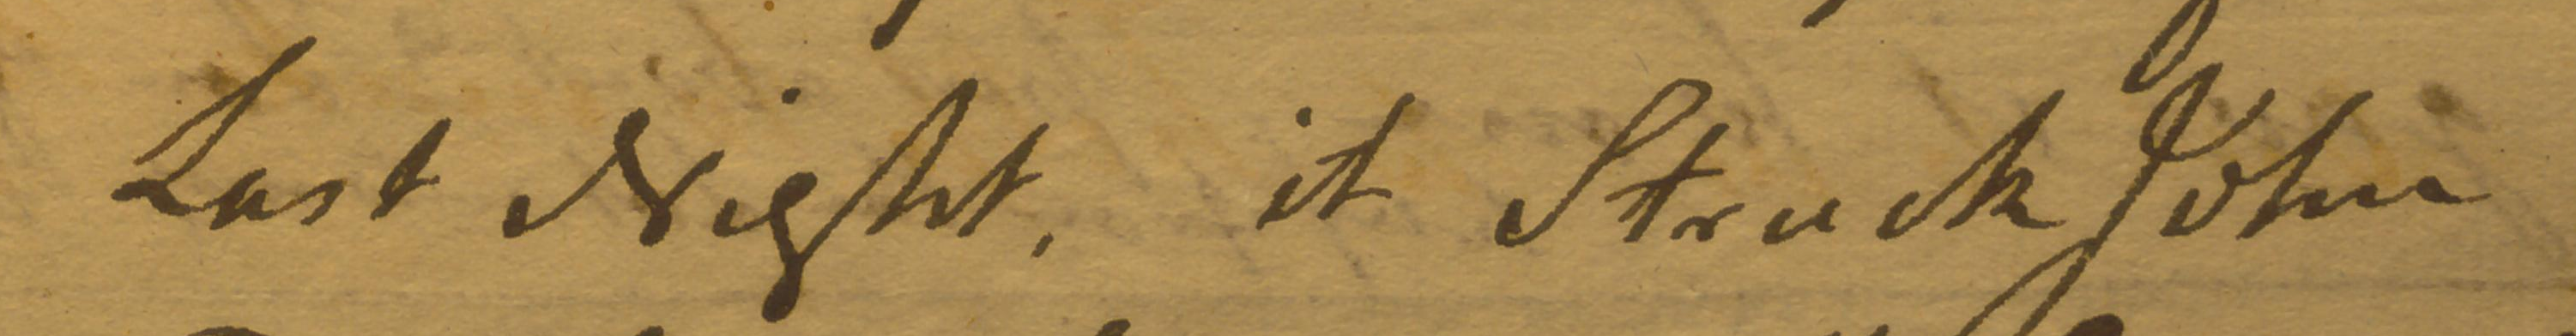Last Night, it Struck John
